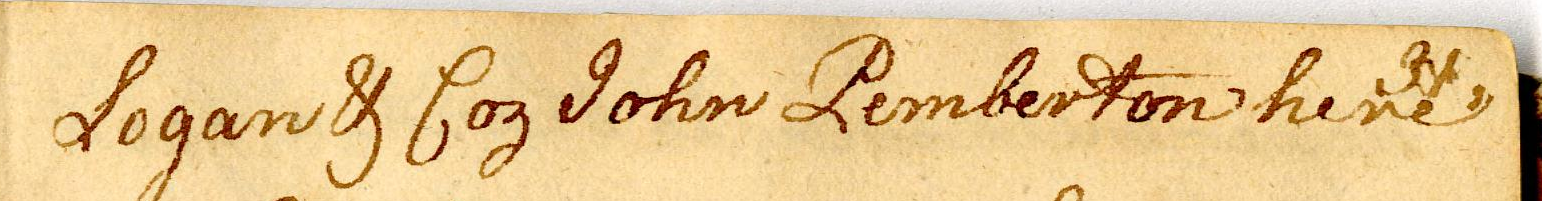Logan & Coz John Pemberton here
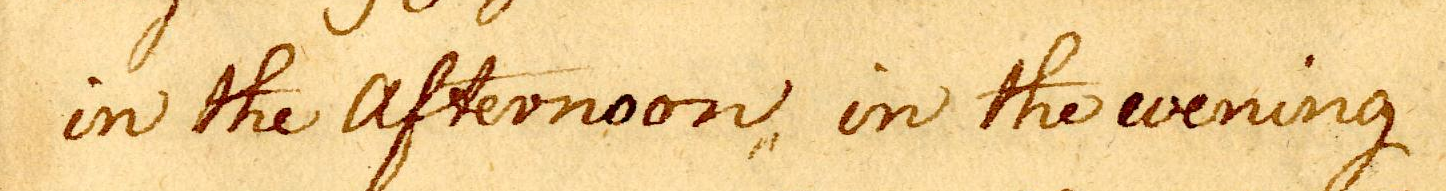in the Afternoon in the evening
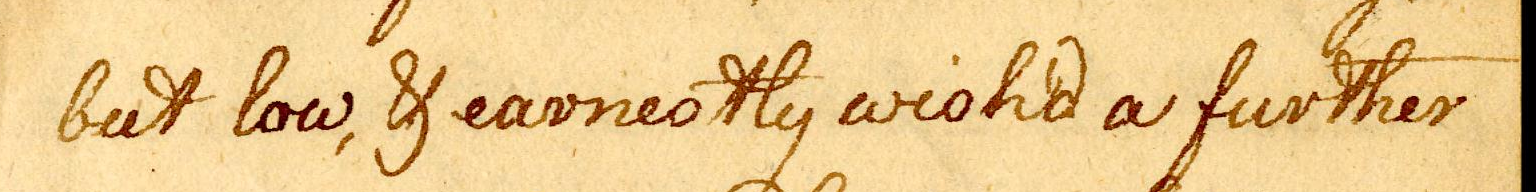but low, & earnestly wish'd a further
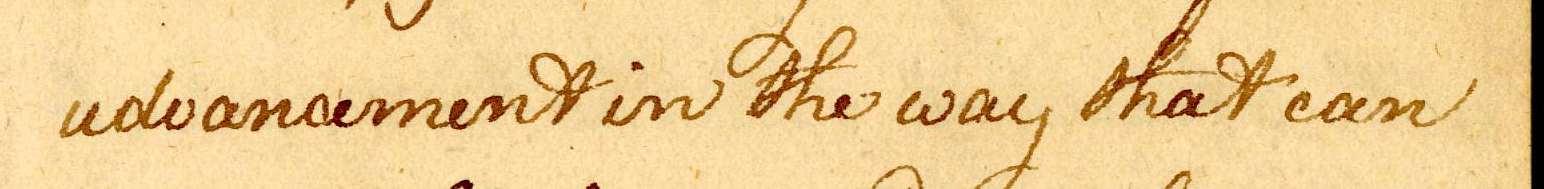udvancement in the way that can
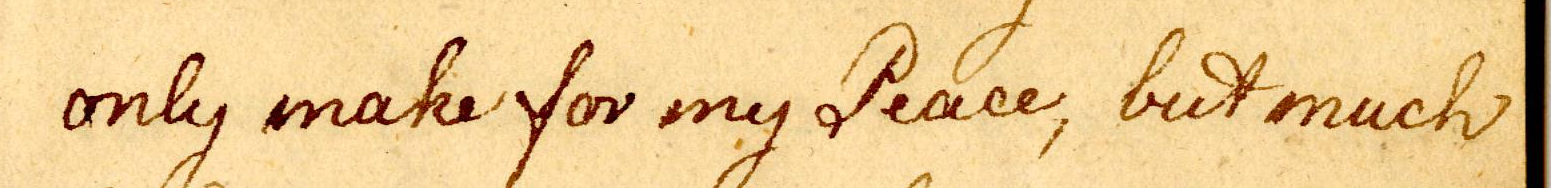only make for my Peace, but much
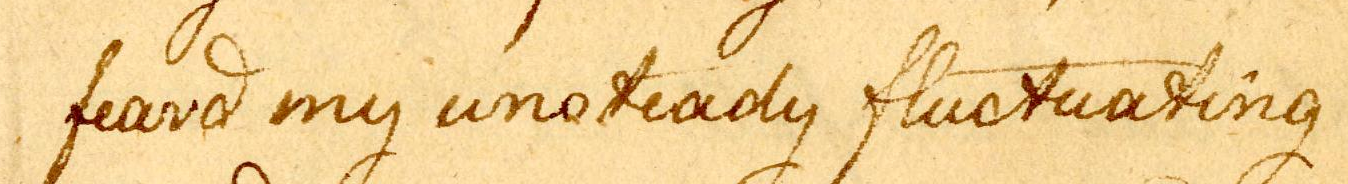feard my unsteady fluctuating
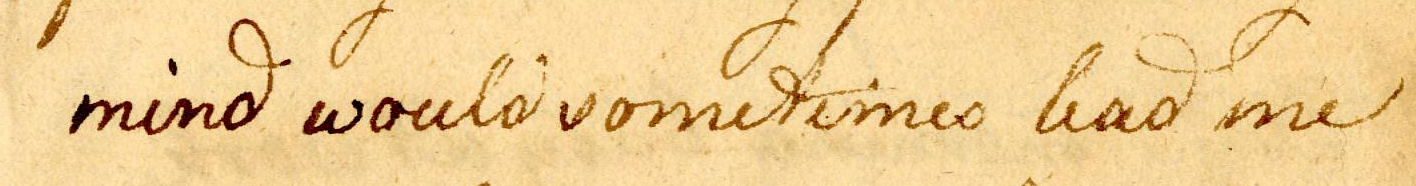mind would sometimes lead me
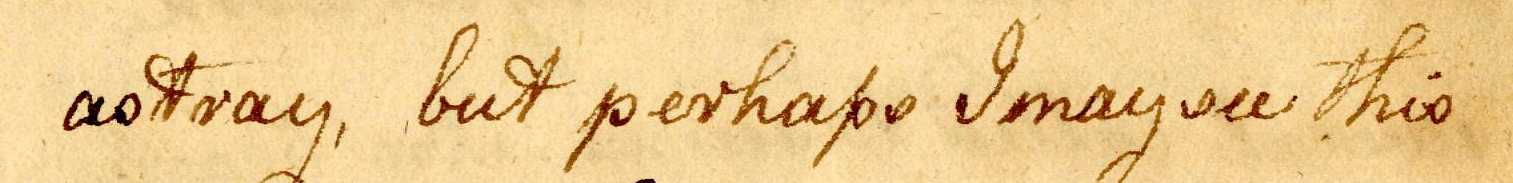astray, but perhaps I may see this
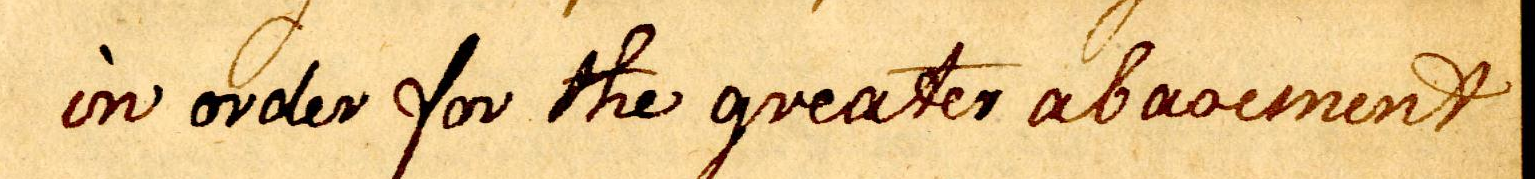in order for the greater abasement
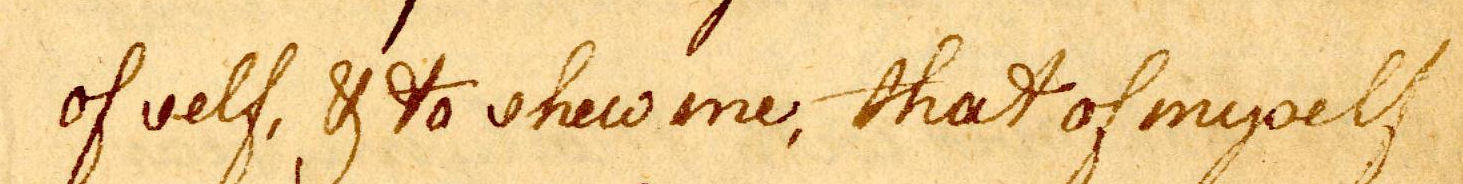of self, & to show me, that of myself
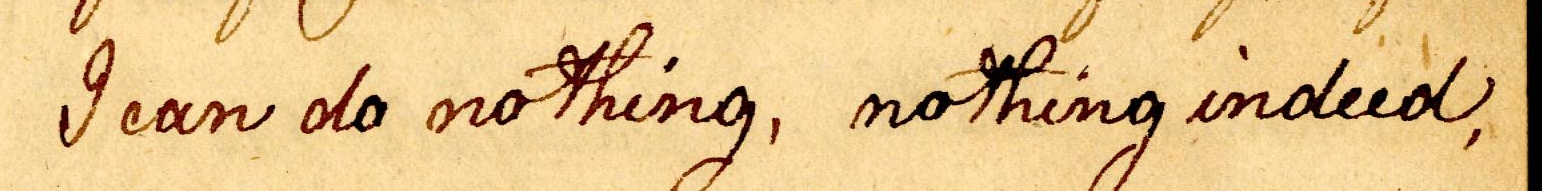I can do nothing, nothing indeed,
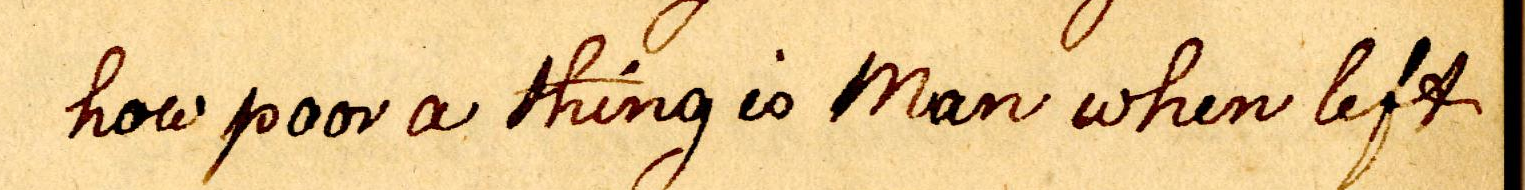how poor a thing is Man when left
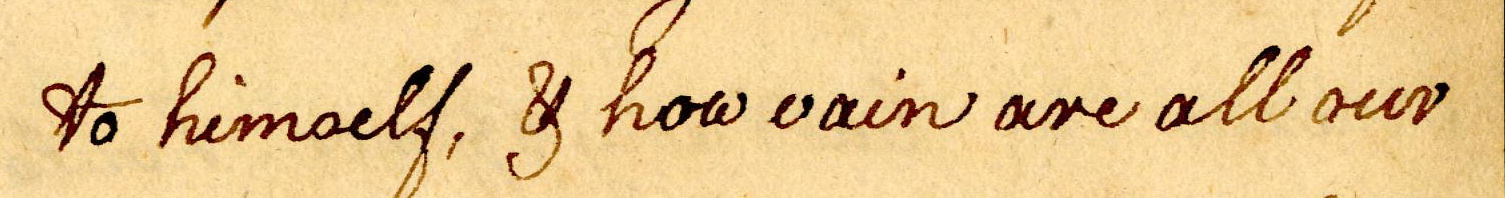to himself, & how vain are all our
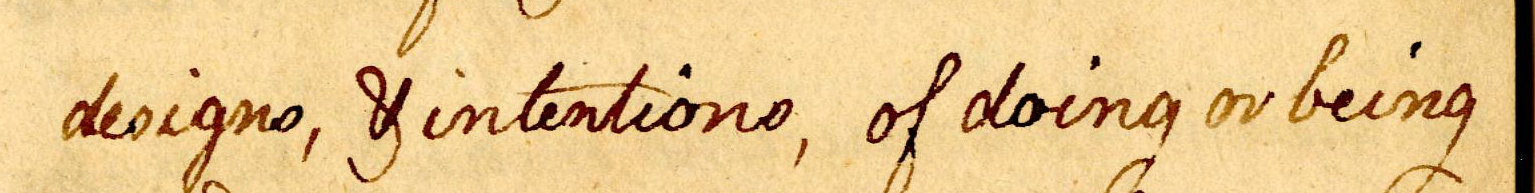designs, & intentions, of doing or being
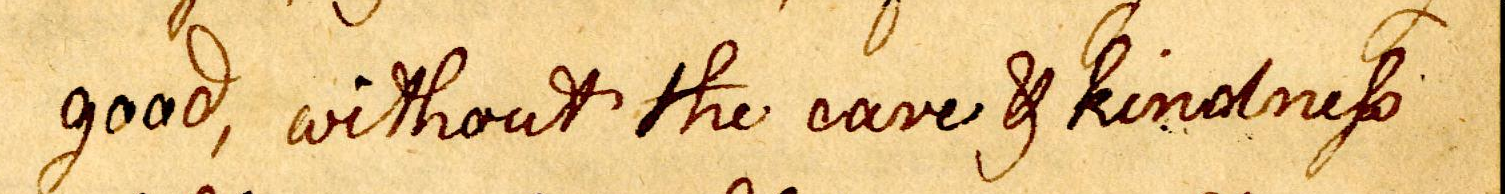good, without the care & kindness
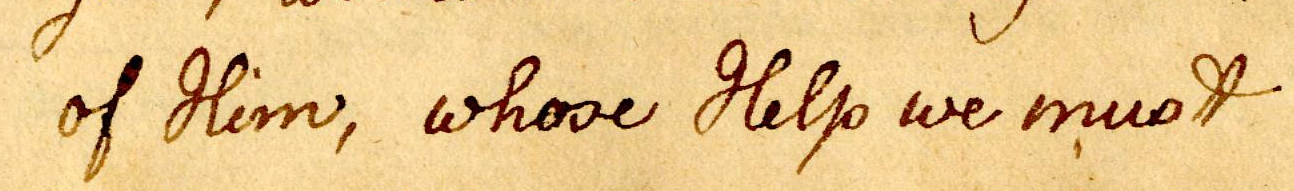of Him, whose Help we must
